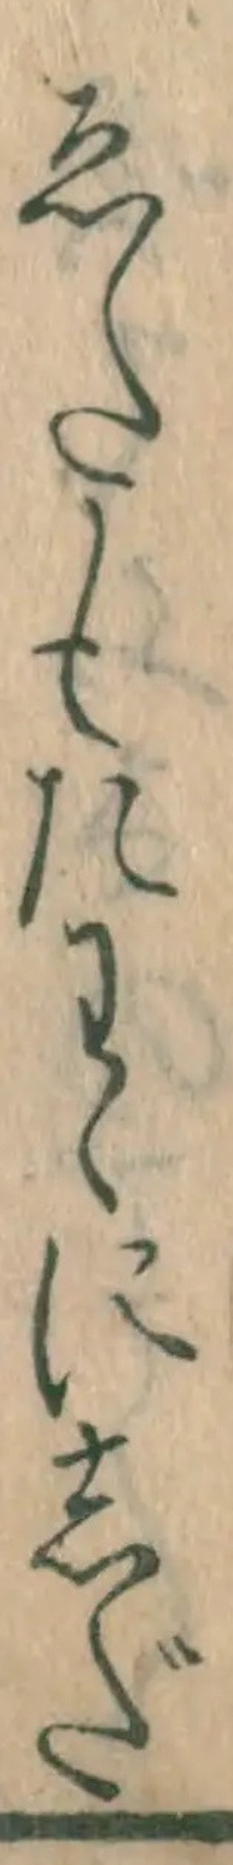ゑたもたわゝにしだ
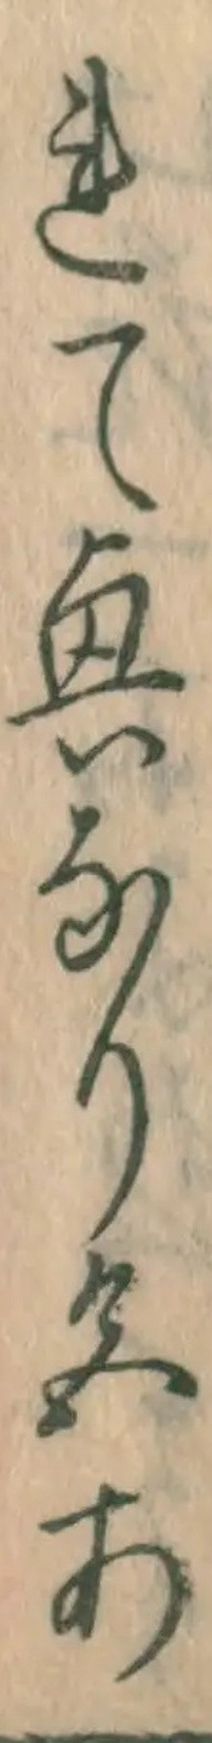れて興なり色あ
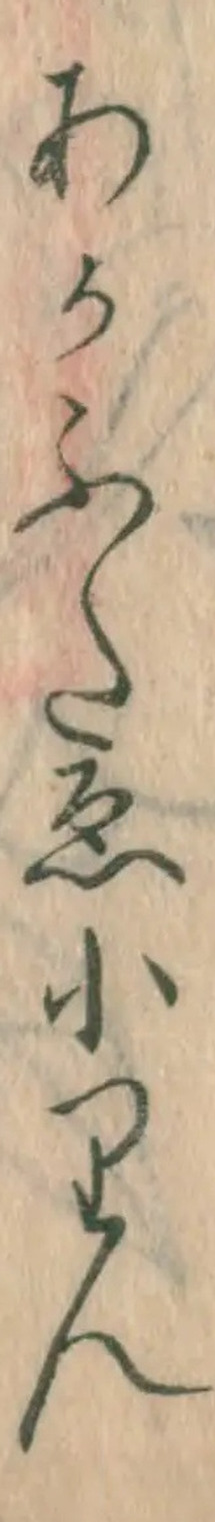あかふたゑ小りん
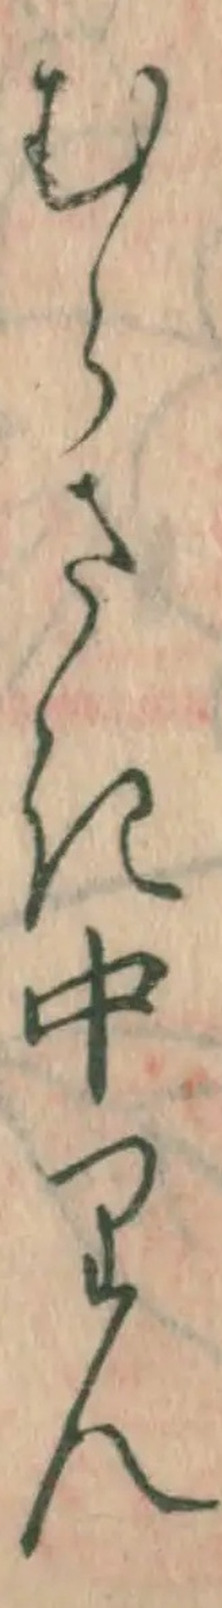むらさき中りん
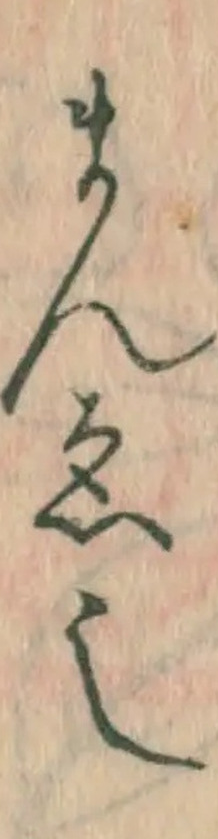まんゑ也
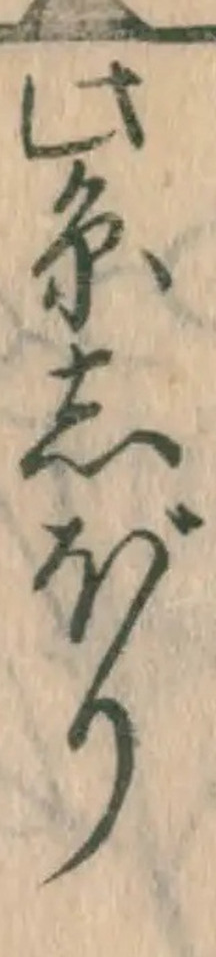▲紫しぼり
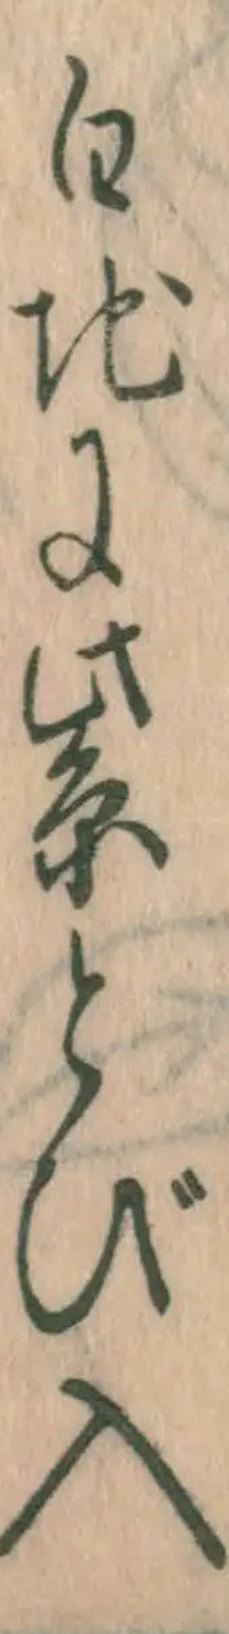白地に紫とび入
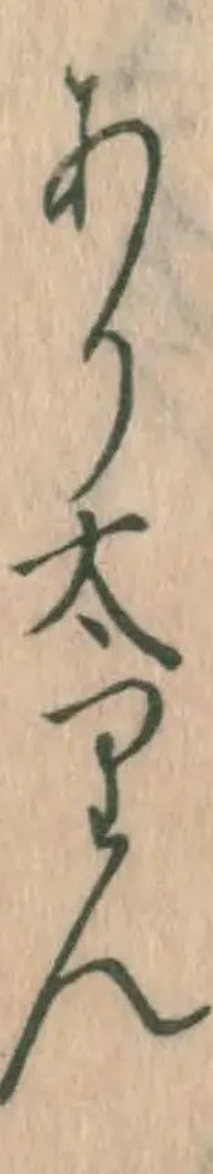あり太りん
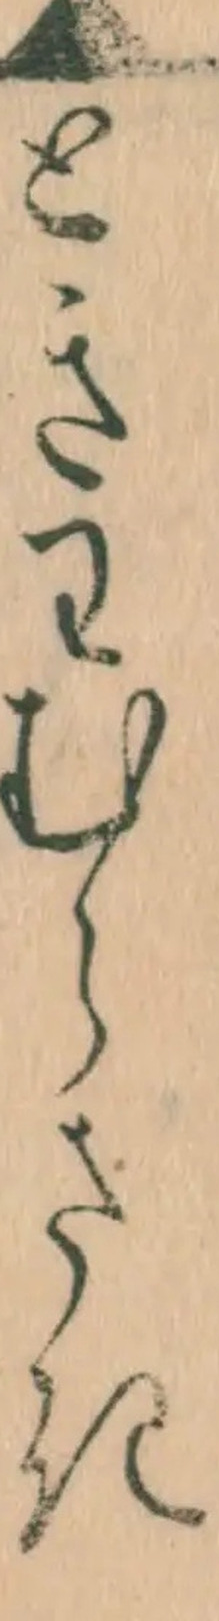▲ときわむらさき
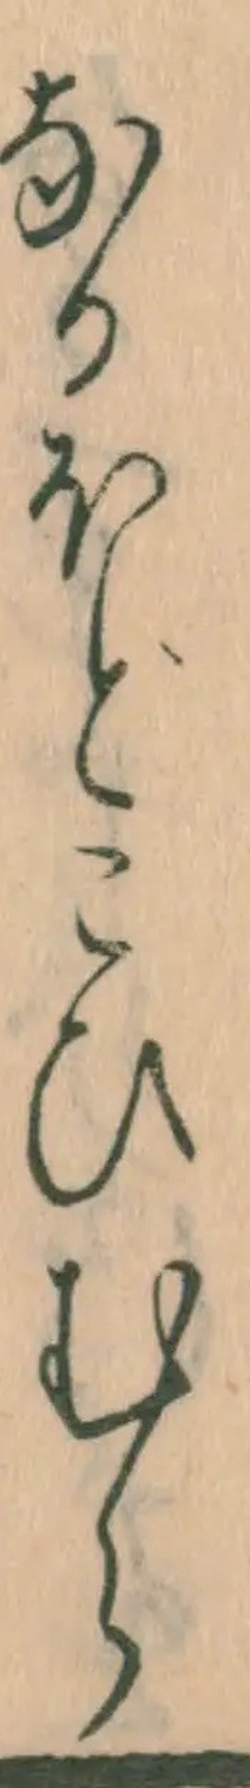なるほどこひむら
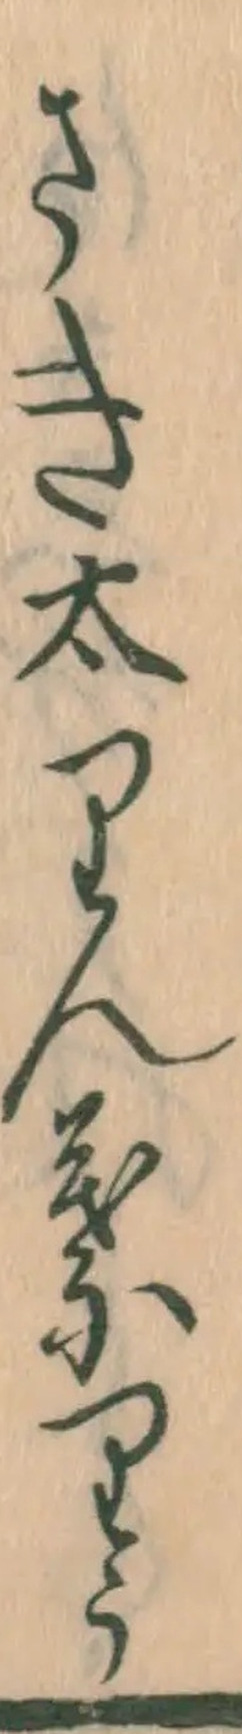さき太りん葉りう
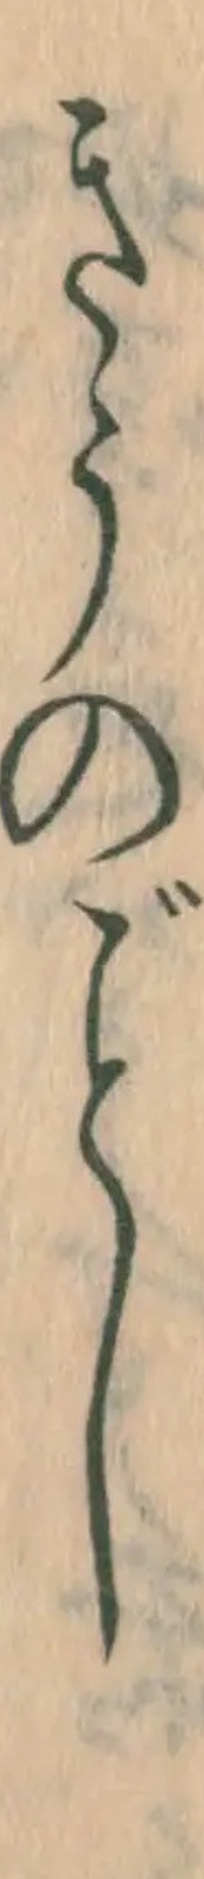きうのごとし
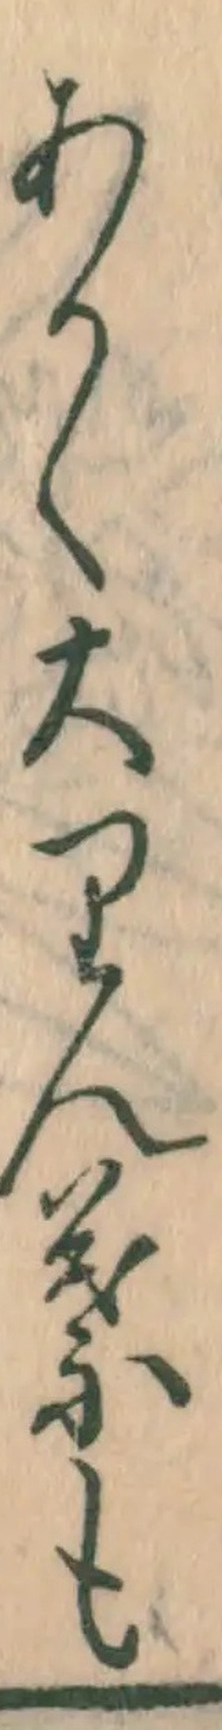あかく大りん葉も
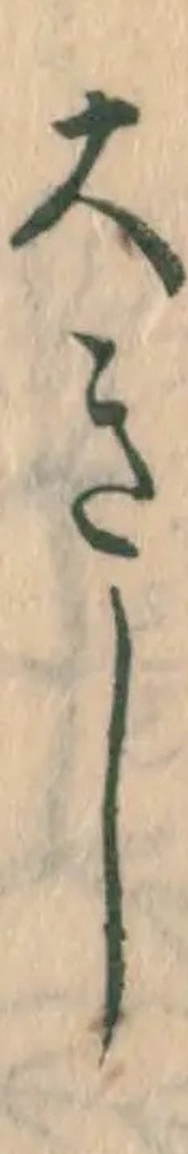大きし
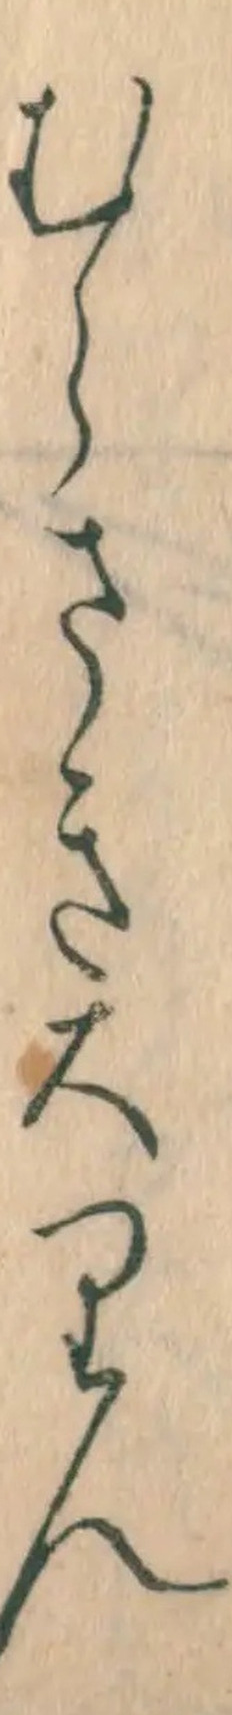むらさき大りん
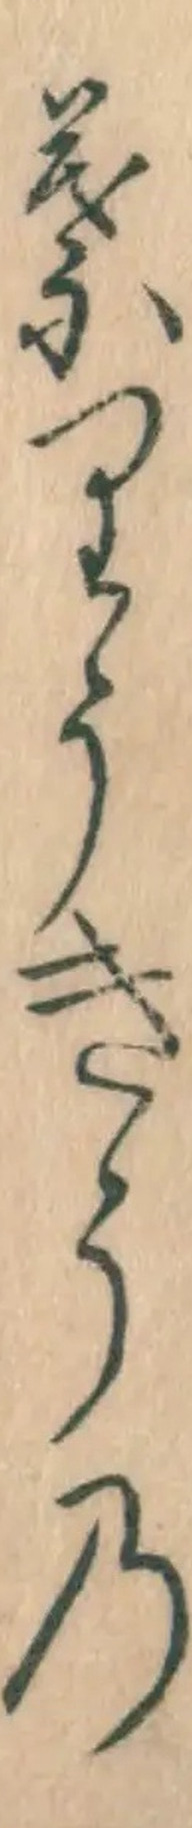葉りうきうの
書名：錦繍枕 5巻. [3]
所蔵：国立国会図書館 National Diet Library, JAPAN
